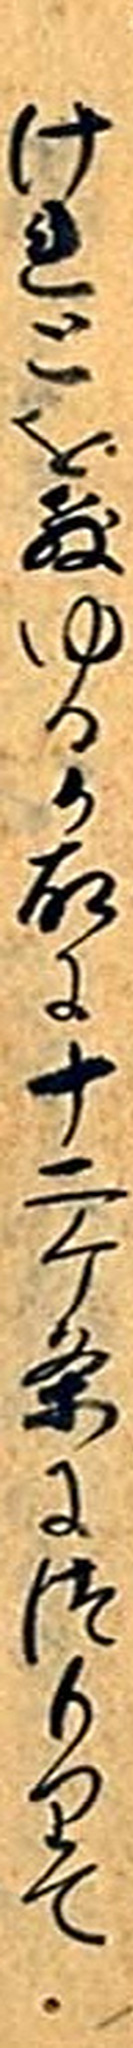けれとを教ゆるか故に十二ケ条につもりて
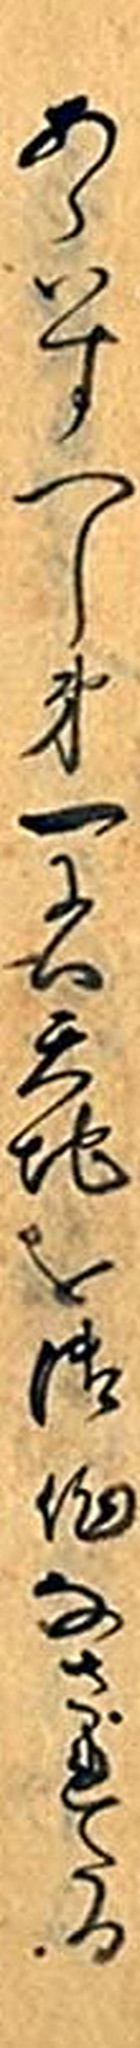あらはすへし第一には天地を御作なされたる
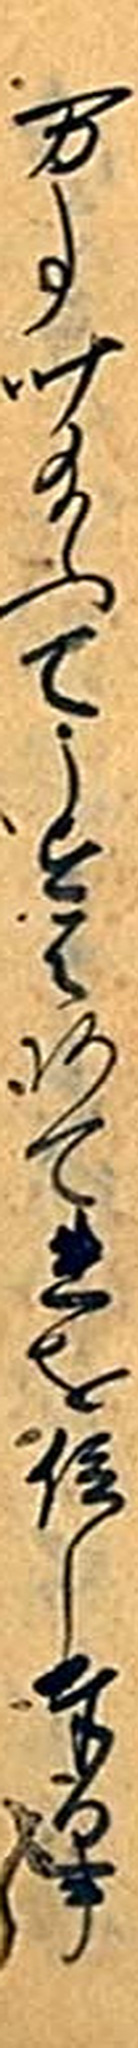万事叶給ふてうすはあてれを信し奉る事
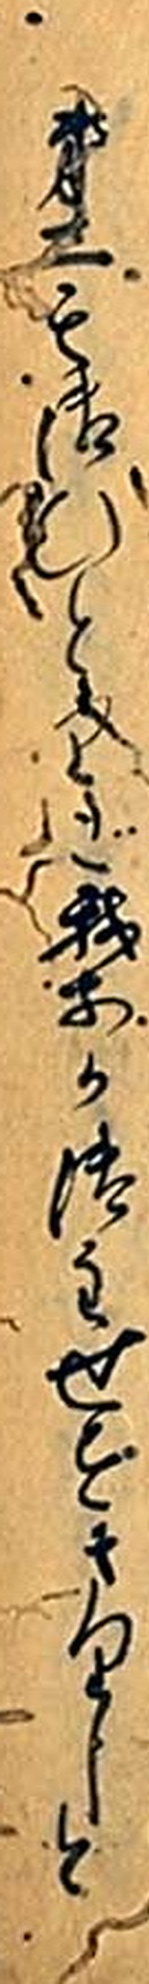第二其御ひとりご我等か御主せすきりしと

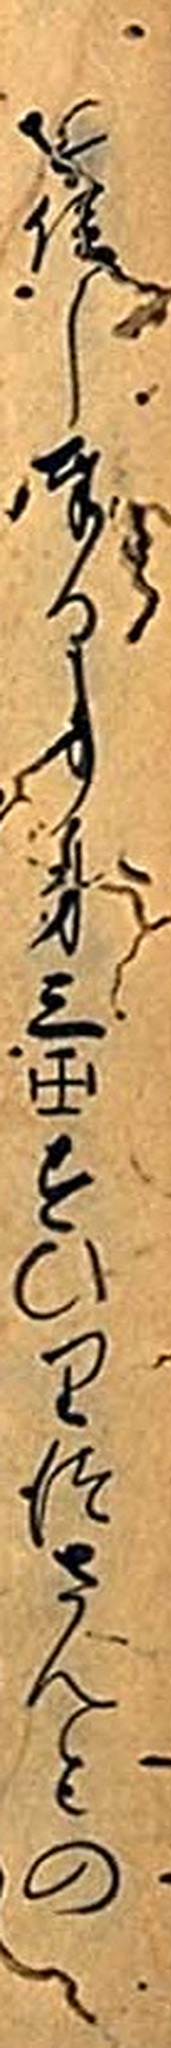を信し奉る事第三☩すひりつさんとの
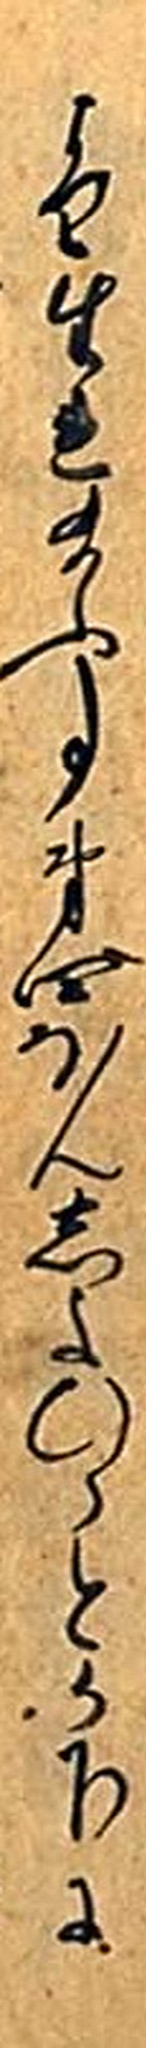より生れ給ふ事第四ほんしよひらとか下に
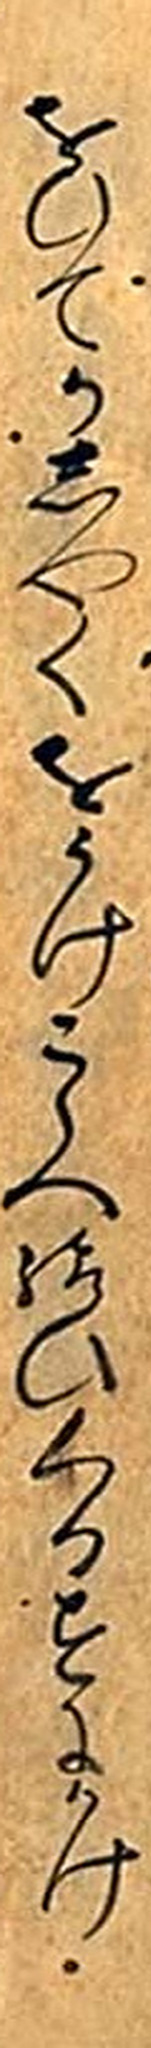をひてかしやくをうけこらへ給ひくるすにかけ
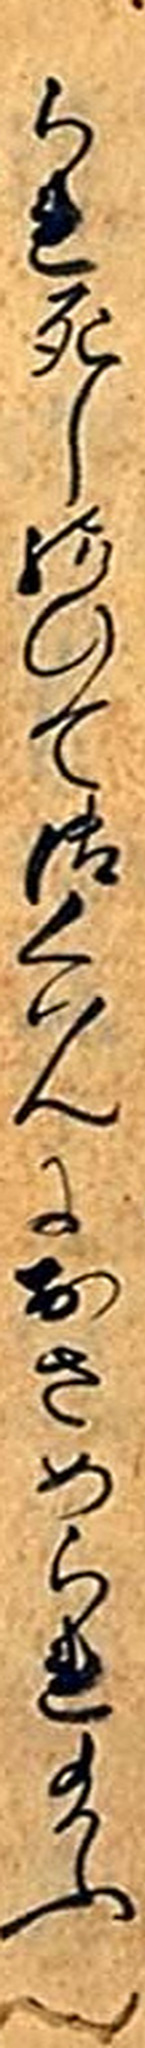られ死し給ひて御くはんにおさめられ給ふ
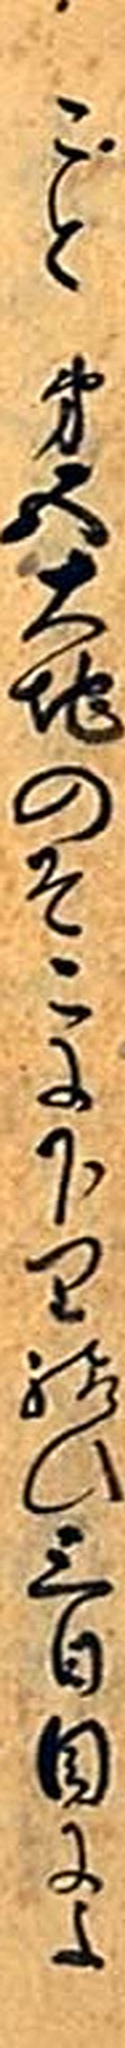こと第五大地のそこに下り給ひ三日目によ
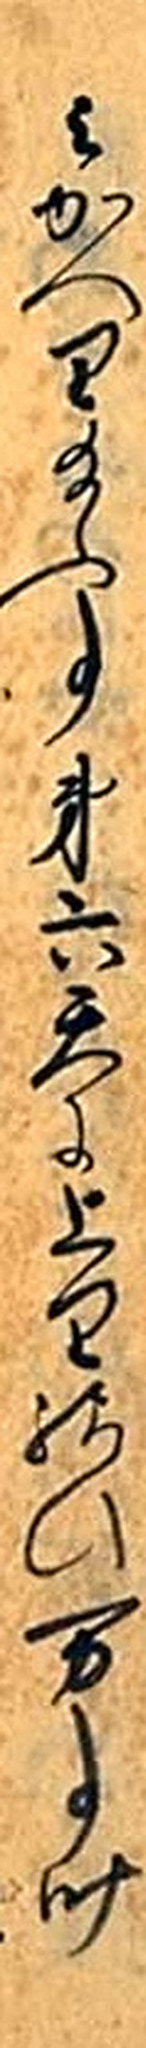みかへり給ふ事第六天に上り給ひ万事叶
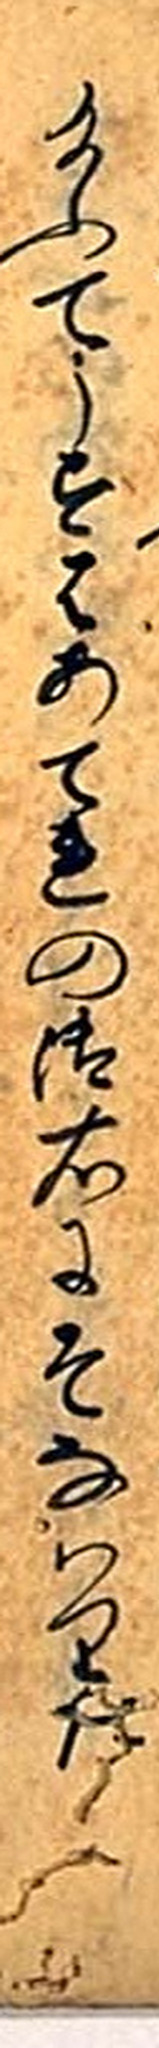給ふてうすはあてれの御右にそなはりた
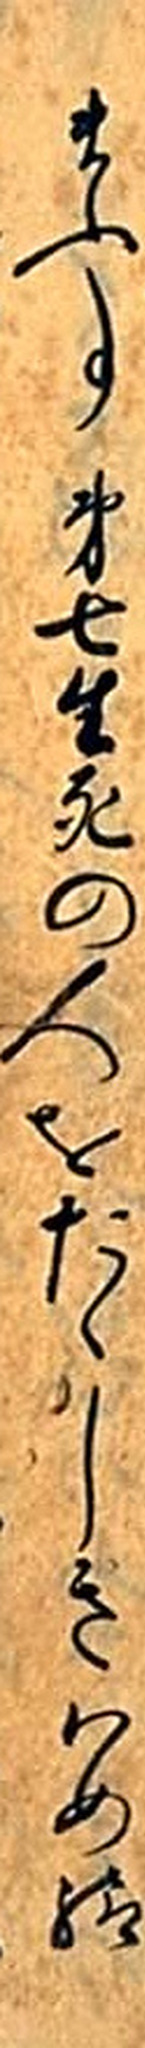まふ事第七生死の人をたゝしきはめ給
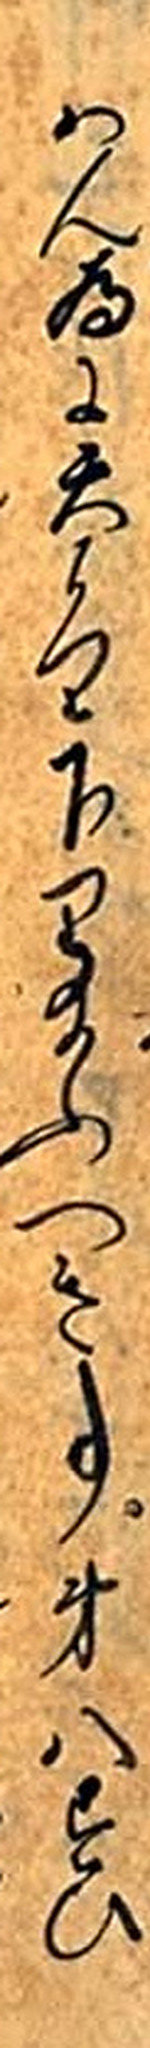はん為に天より下り給ふへき事第八すひ
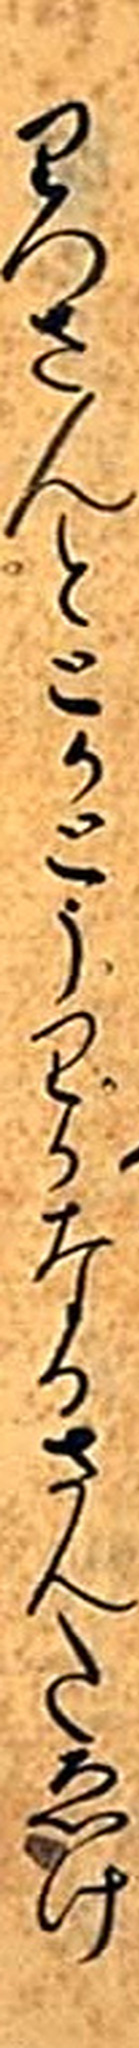りつさんととかとうりかなるさんたゑけ
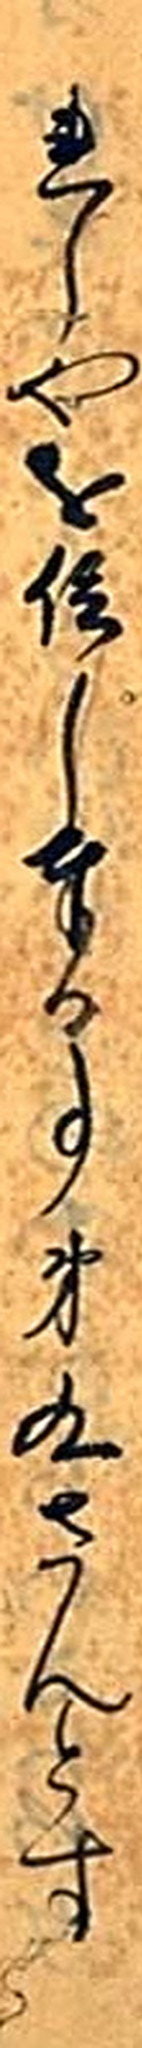れしやを信し奉る事第九さんとす
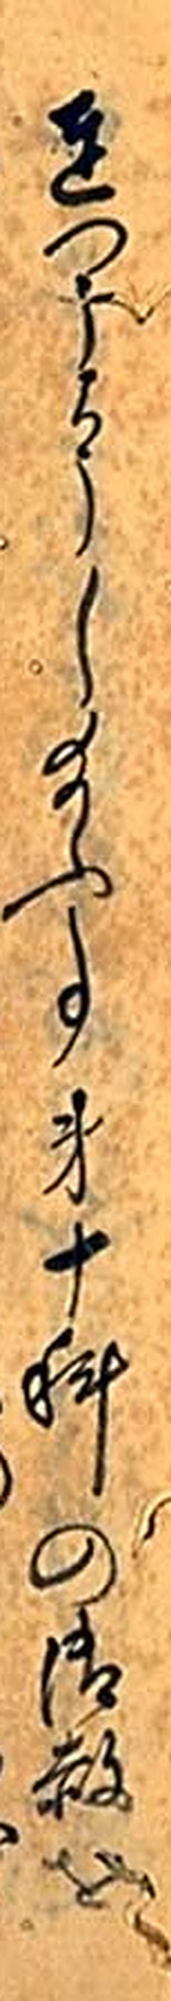達つうようし給ふ事第十科の御赦を
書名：ドチリナ・キリシタン
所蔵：東京大学総合図書館 / General Library in the University of Tokyo
